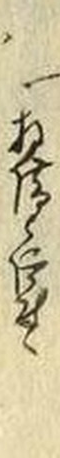拝借被仰付候
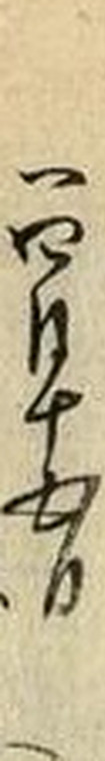一四月十五日
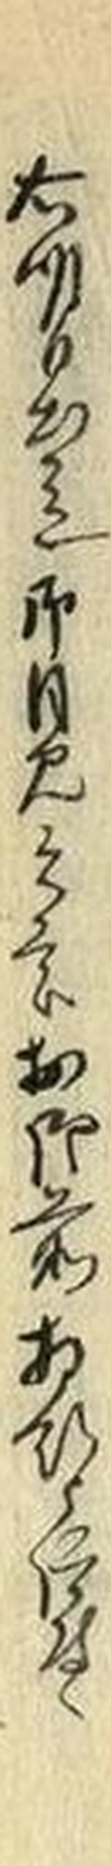右明日出立御目見之節於御前拝領被仰付候
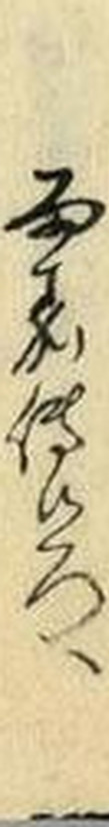雨森伝左衛門へ
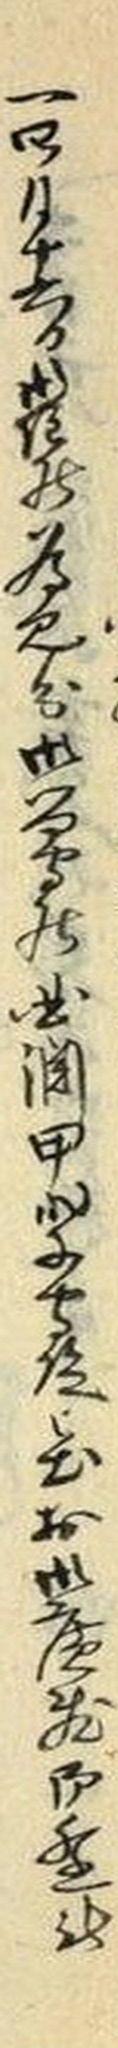一四月十六日御住居為見分御留守居曲渕甲斐守殿被出於御広式御逢被
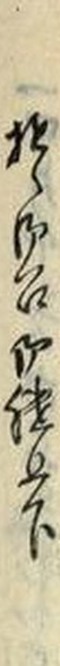遊候御召御継上下
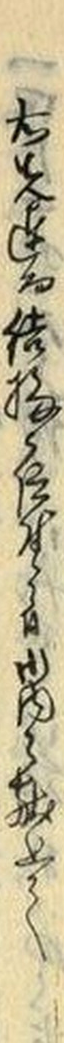右先達而結構被仰付候ニ付御内々献上之
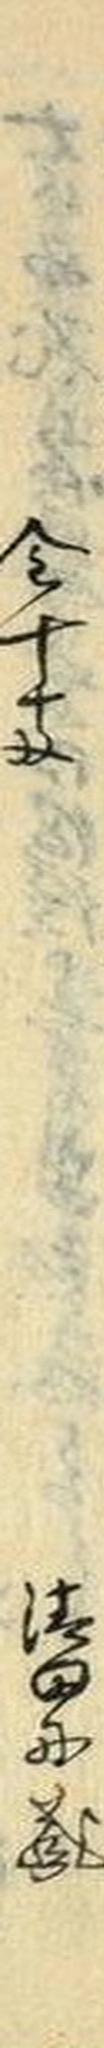金十両清田丹蔵
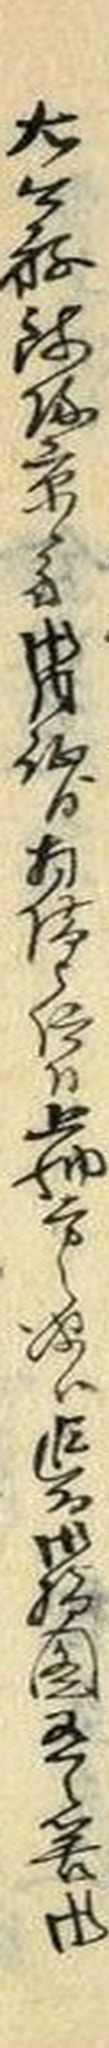右今般致帰京候ニ付御内証ゟ拝借被仰付上納方之儀ハ追而御指図有之筈御
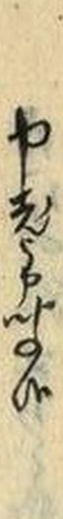中老被申聞候
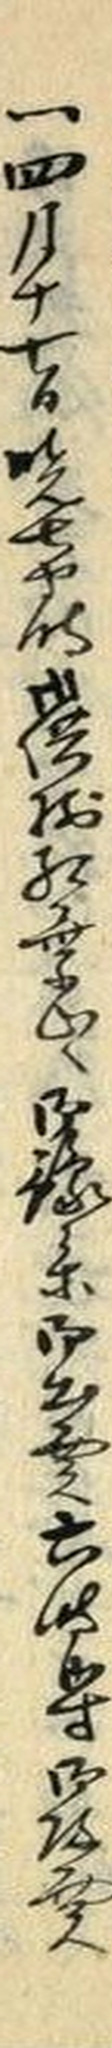一四月十七日晩七半時御供揃紅葉山へ御豫参御出殿六時弐寸御帰殿
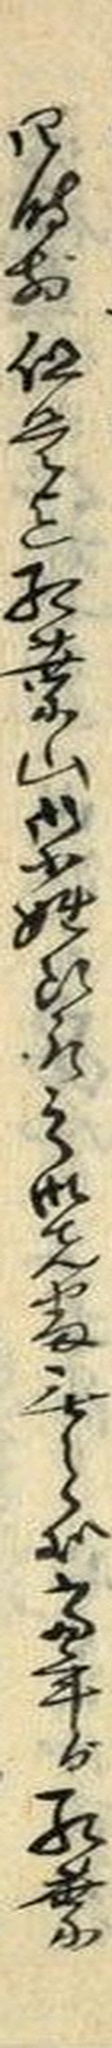四時前但是迄紅葉山御小姓頭取之御先番無之候処当年ゟ紅葉
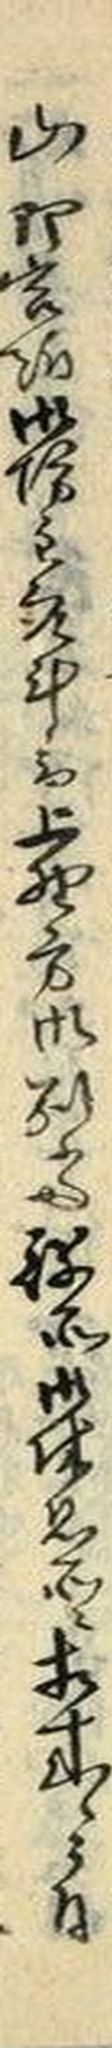山御宮附御坊主取斗ニ而上野方御別当役所御休息所ニ相成候ニ付
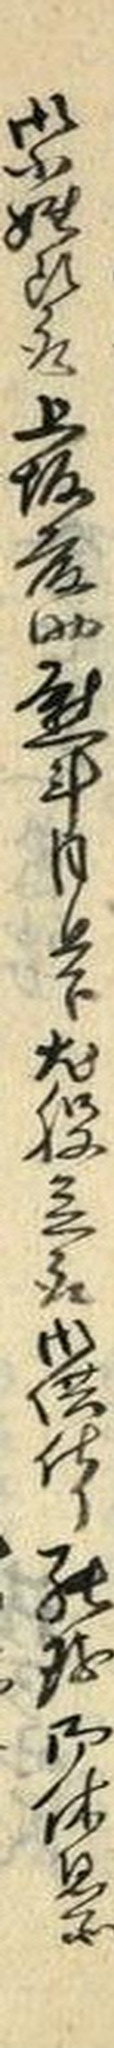御小姓頭取上坂藤助熨斗目上下尤股立取御供仕り罷帰御休息所
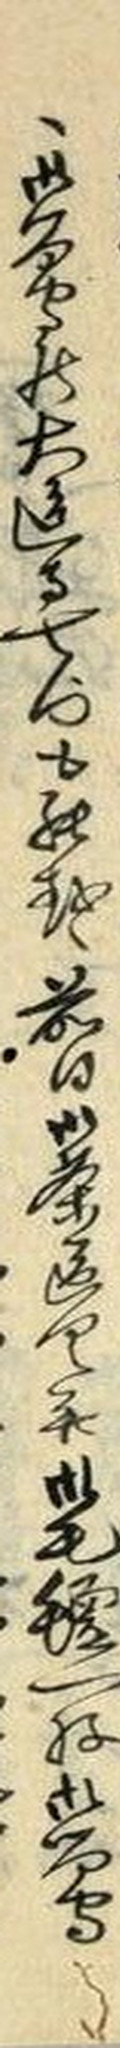へ御留守居大道寺七右衛門も罷越候前日御茶道具并御毛氈一枚御留守
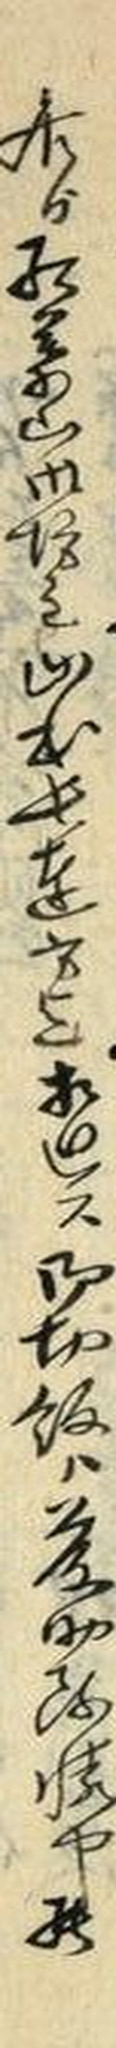居ゟ紅葉山御坊主山本長達方迄相廻ス御切飯ハ藤助致懐中罷
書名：少傅日録抄（斉承付側向頭取日記、在府）
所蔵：福井県文書館 Fukui Prefectural Archives
